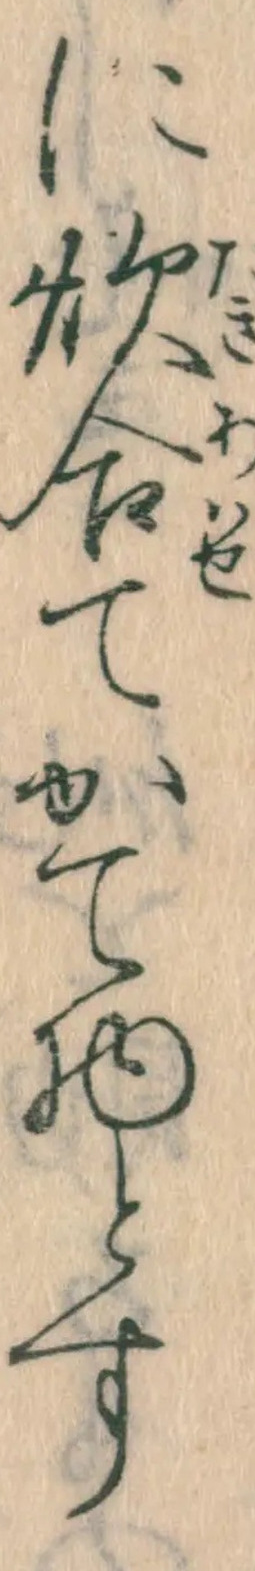に炊合てかて物とす
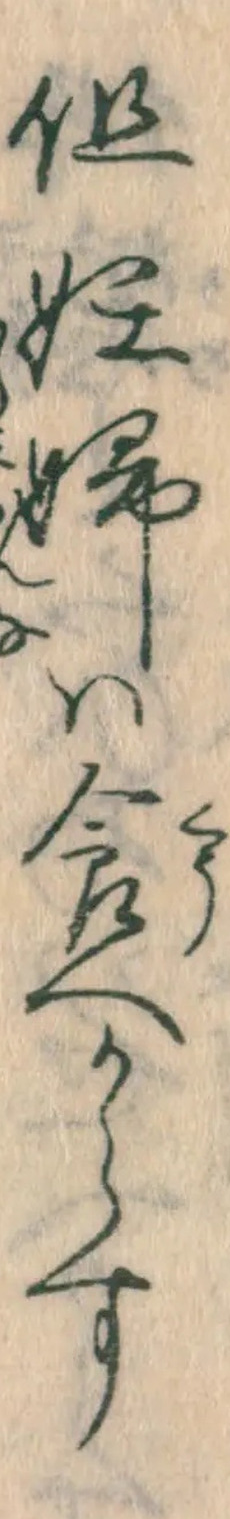但妊婦は食へからす
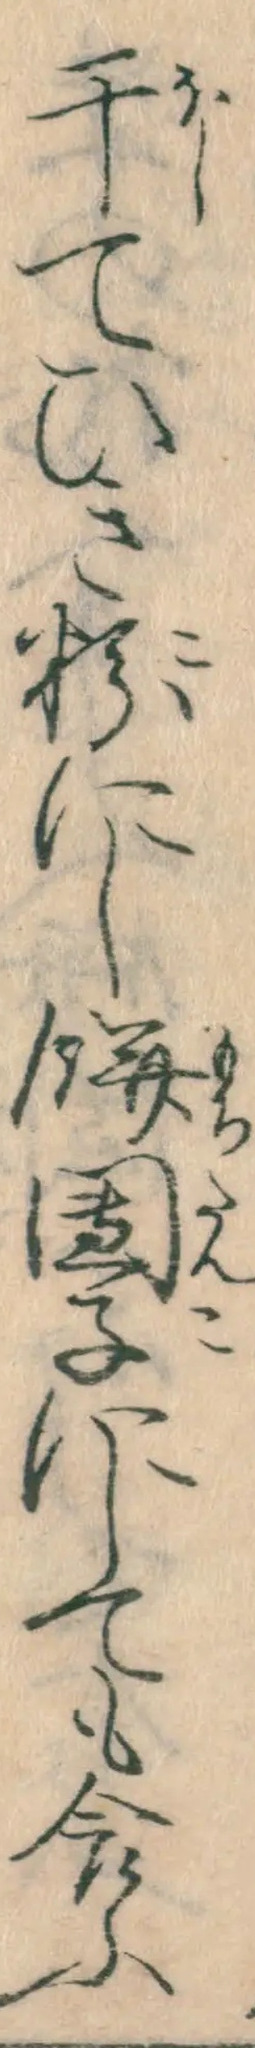干てひき粉にし餅団子にしても食ふ
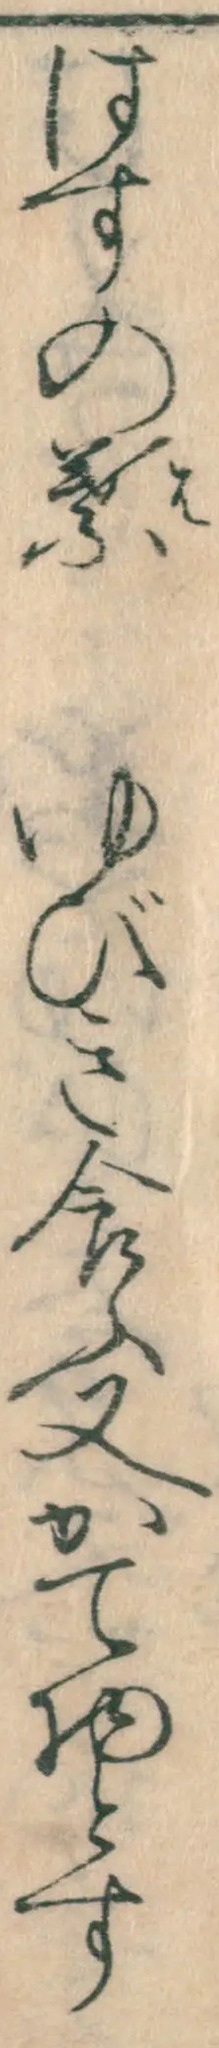はすの葉ゆびき食ふ又かて物とす

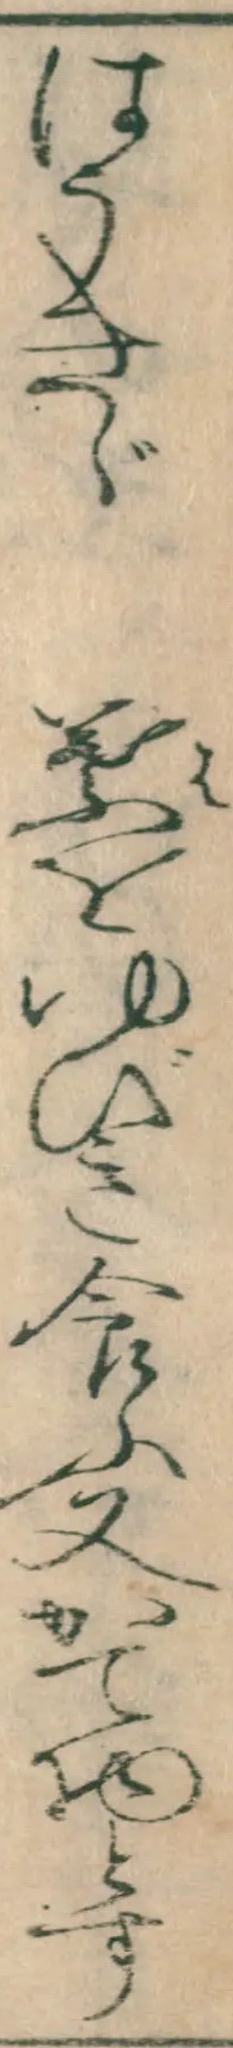はうきゞ葉をゆびき食ふ又かて物とす
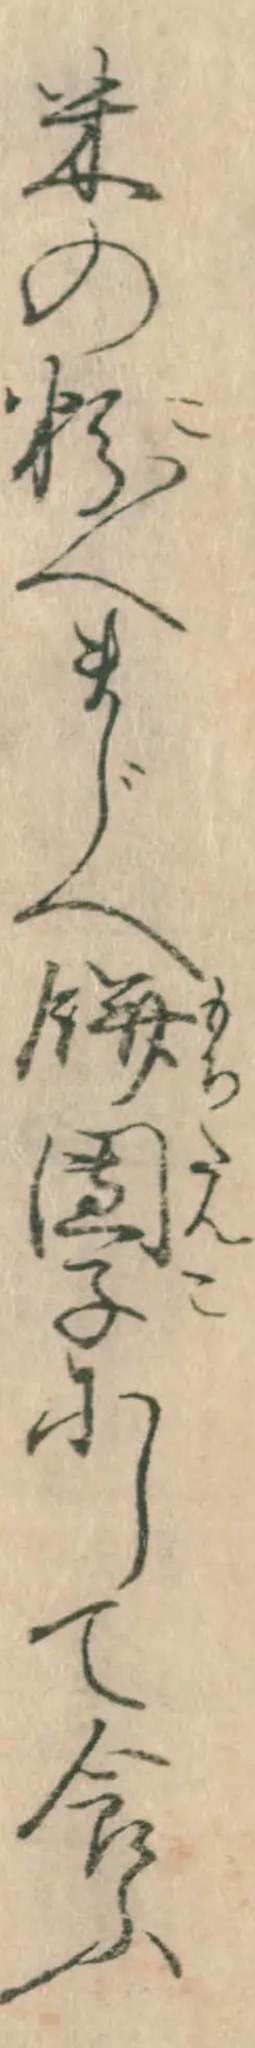米の粉へまじへ餅団子にして食ふ
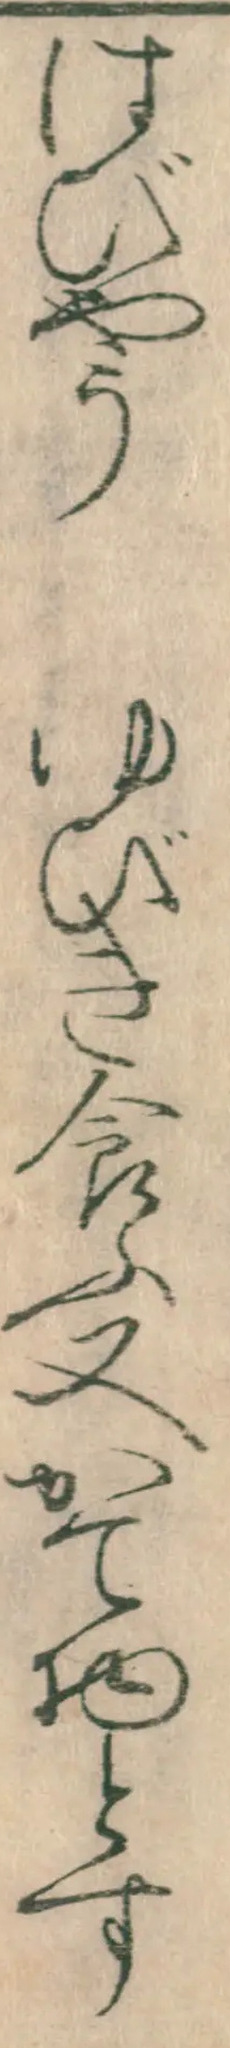はびやうゆびき食ふ又かて物とす
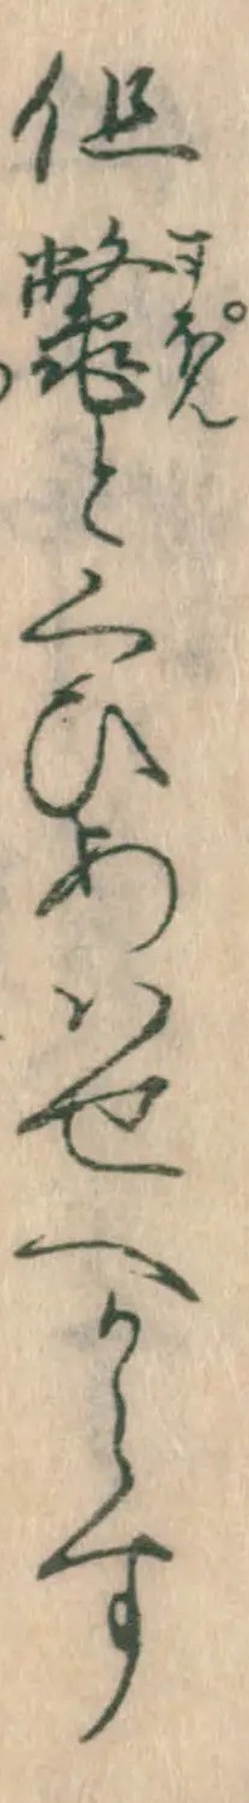但鼈とくひあはせへからす
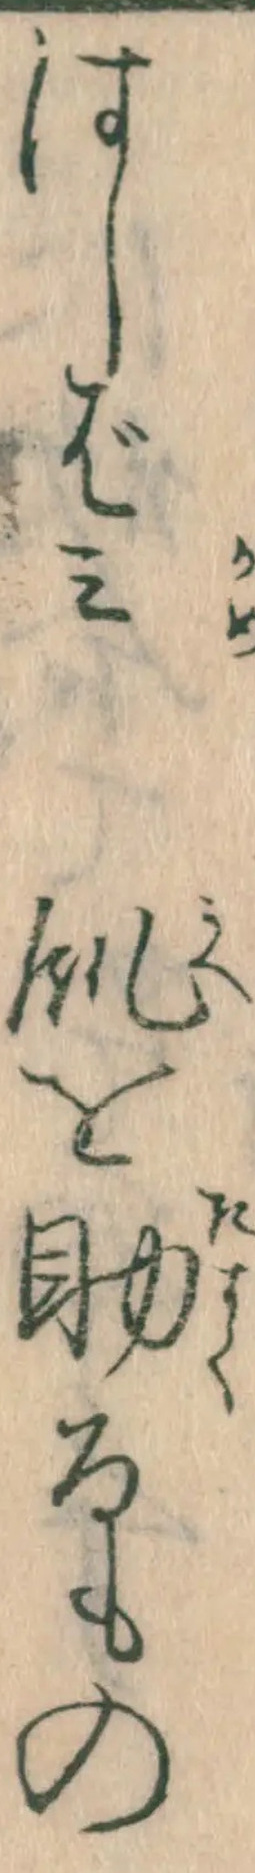はしばみ飢を助るもの
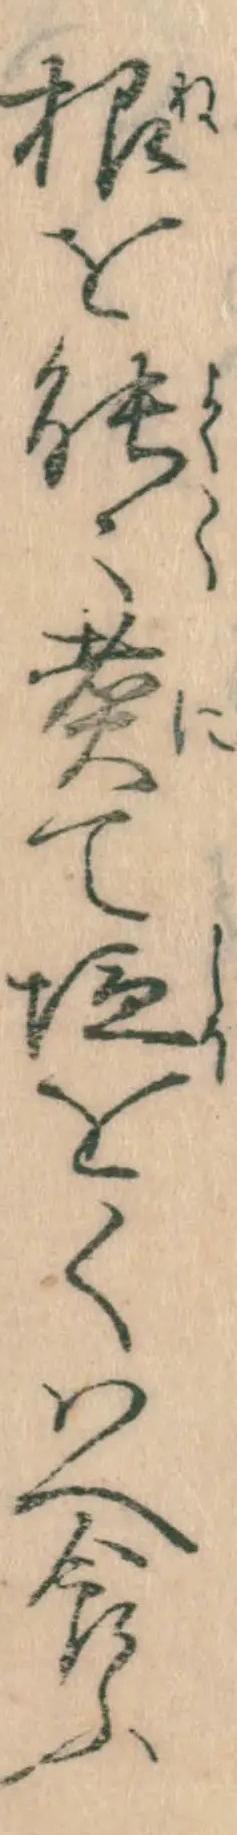ほど根を能々煮て塩をくはへ食ふ
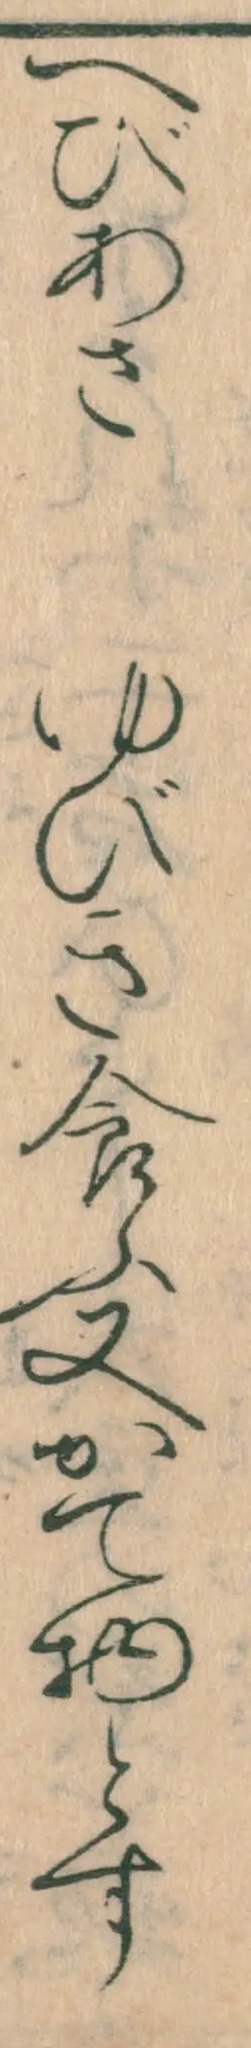へびあさゆびき食ふ又かて物とす
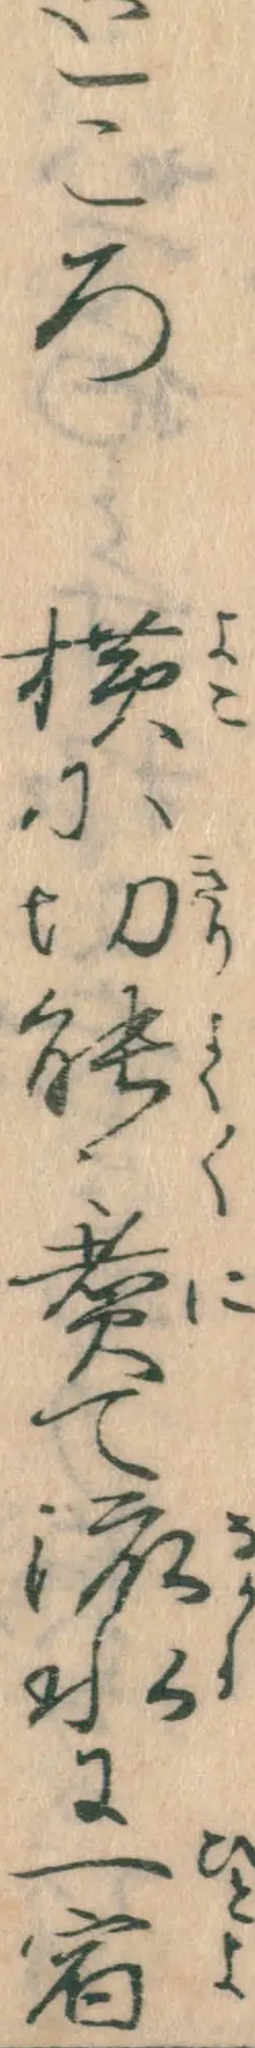ところ横に切能々煮て流水に一宿
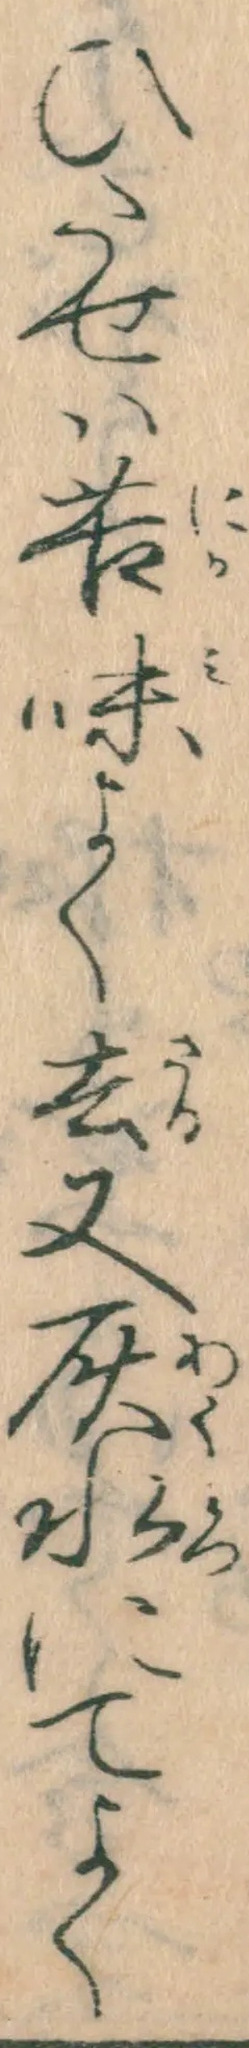ひたせは苦味よく去又灰水にてよく
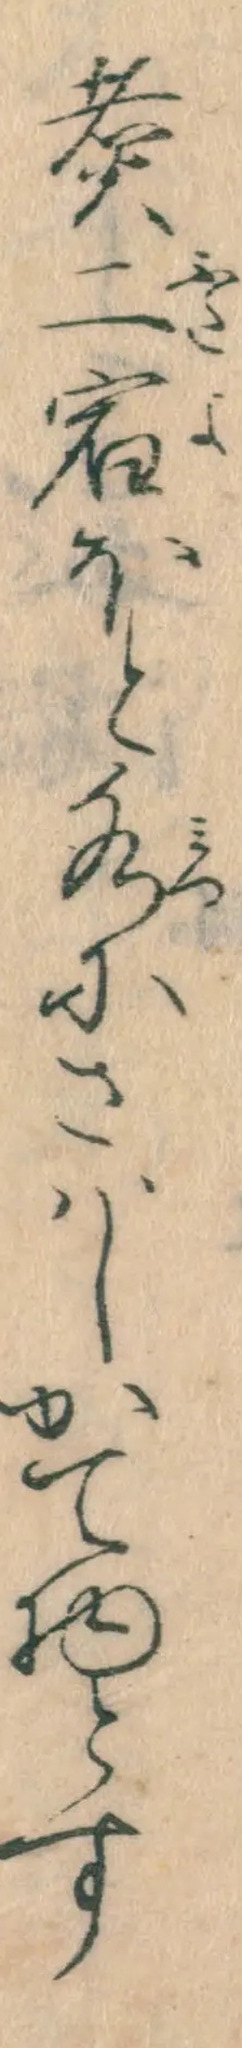煮二宿ほと水にさはしかて物とす
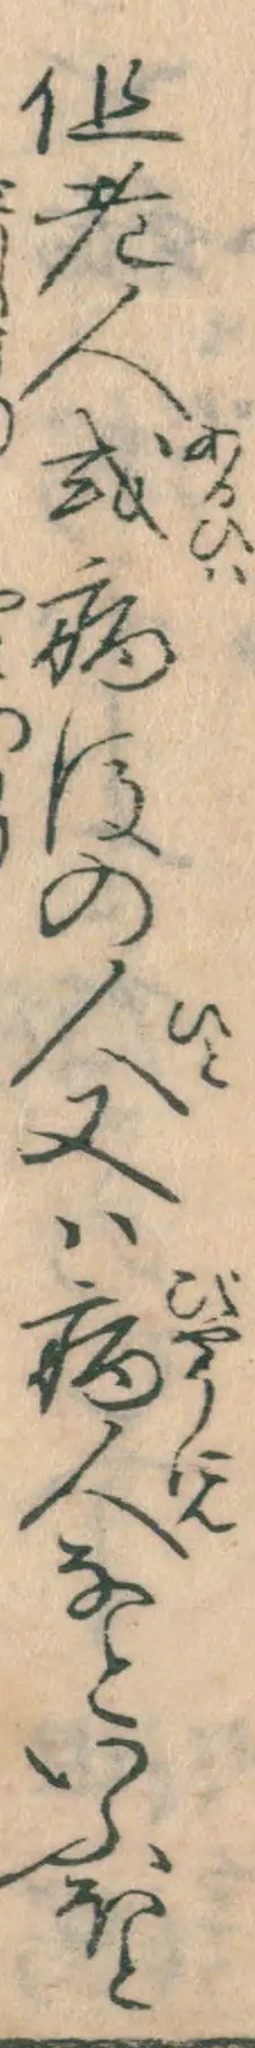但老人或病後の人又は病人なといふほと
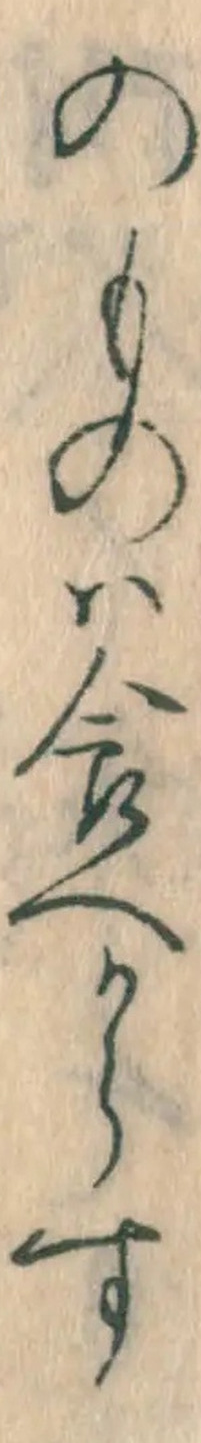のものは食へからす
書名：かてもの
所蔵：国立国会図書館 National Diet Library, JAPAN
